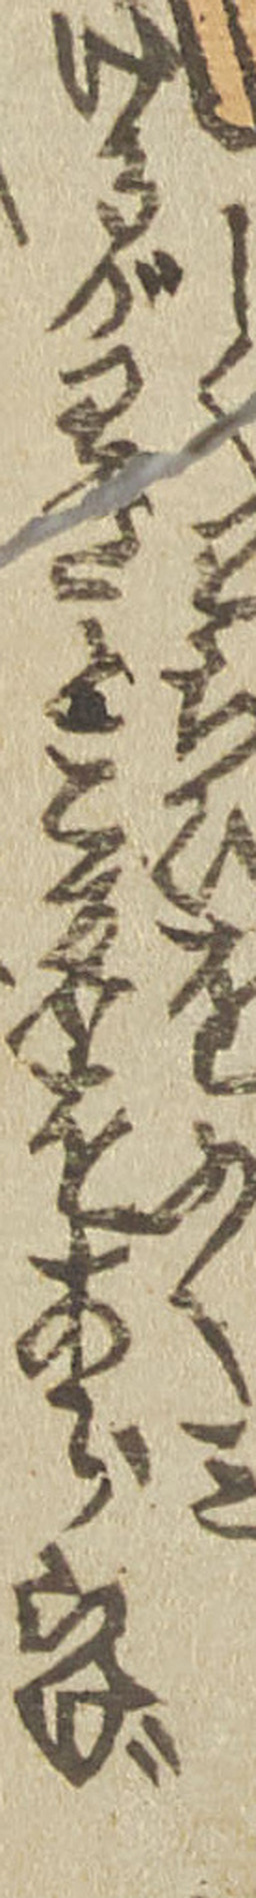けるがわさとこゑをあららげ
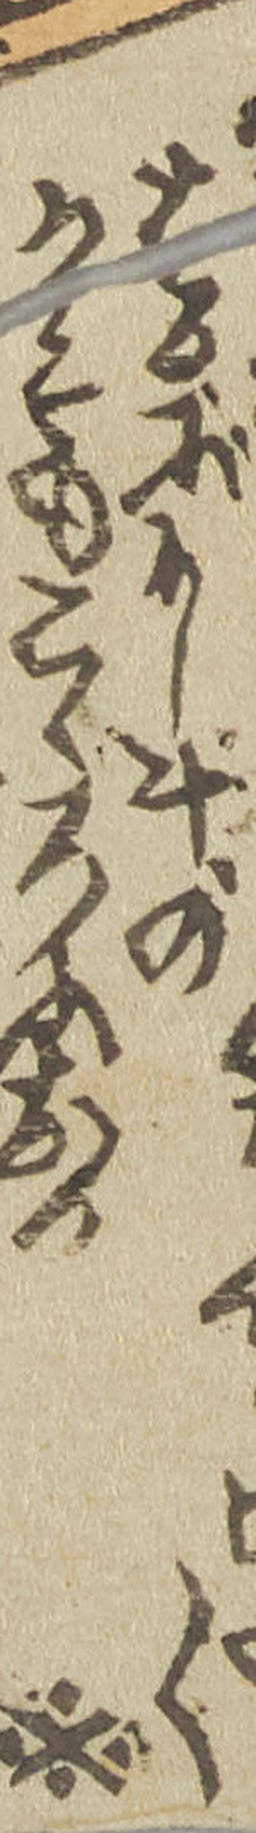かみもこゝろにおか
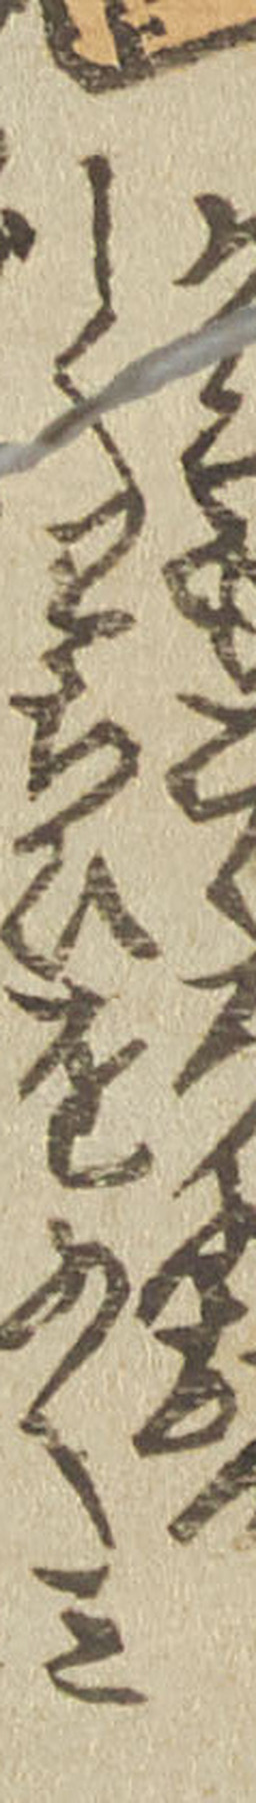しくわらひをふくみ
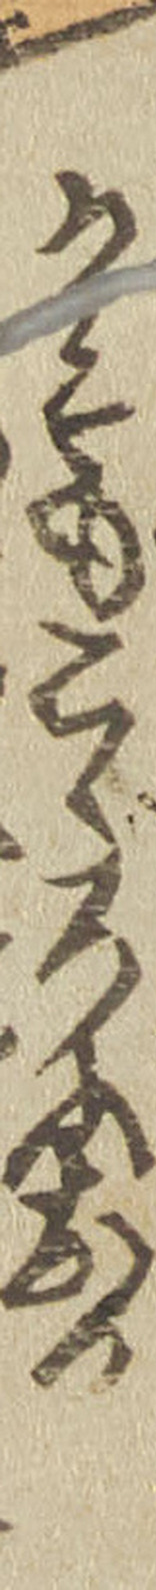かみもこゝろにおか
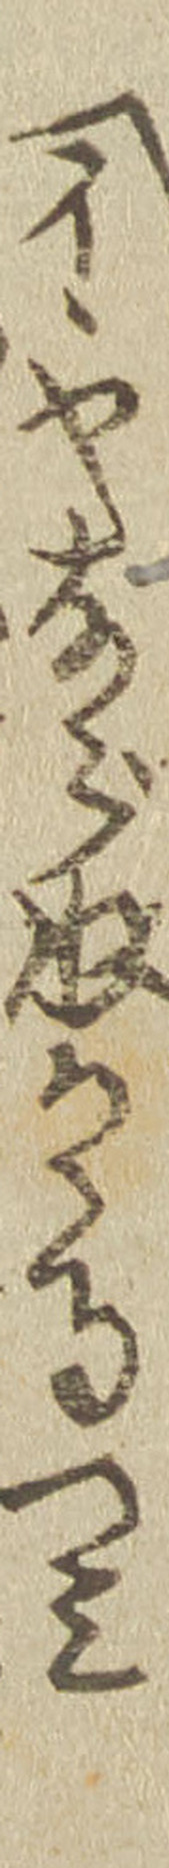〽イヽヤならぬかゝるつみ
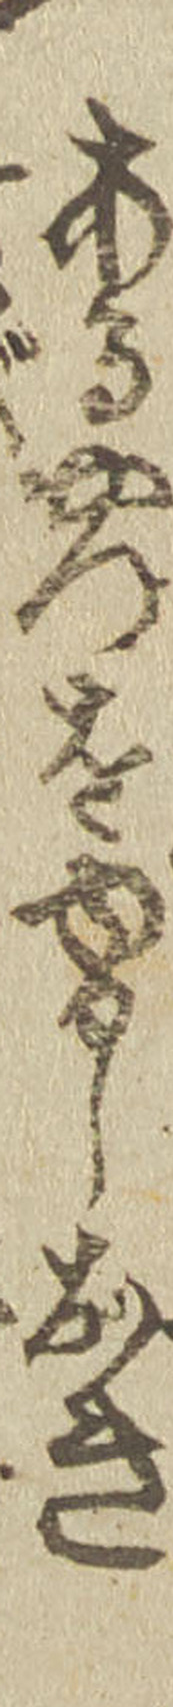あるやつをゆるしおき
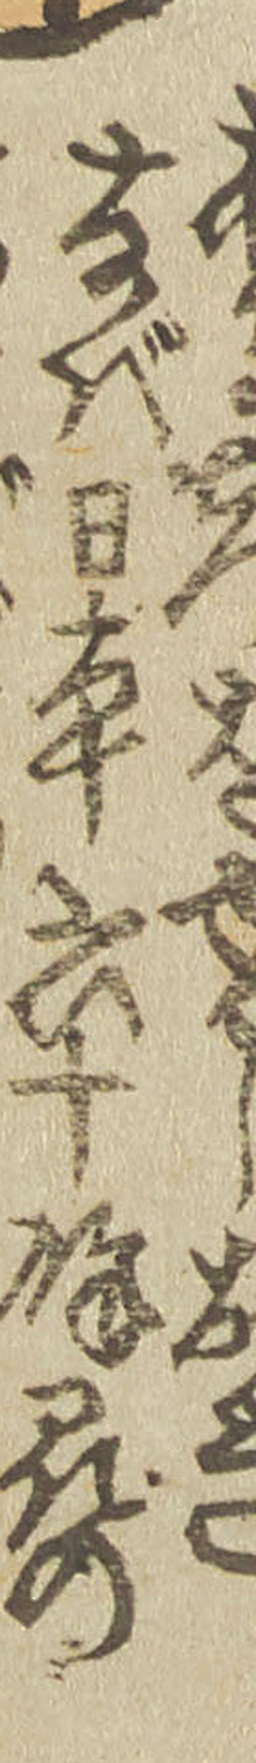なば日本六十餘州の
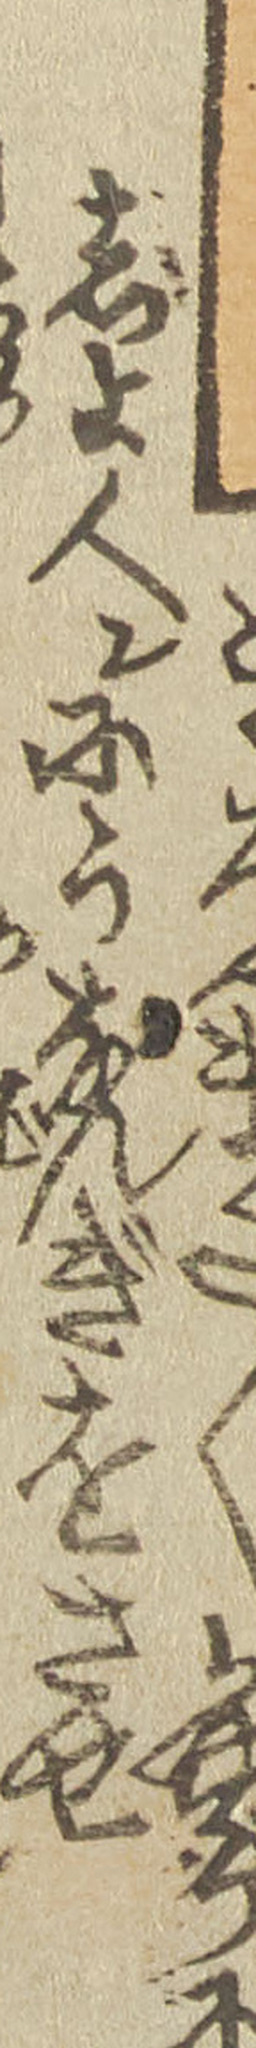しよ人ににうなんぎをさセ
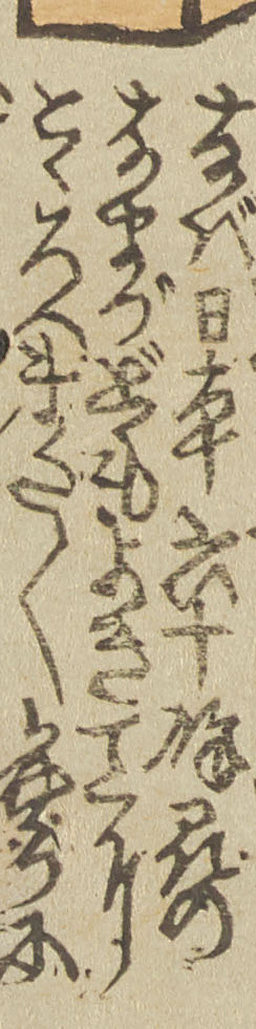なまづどもよきことに
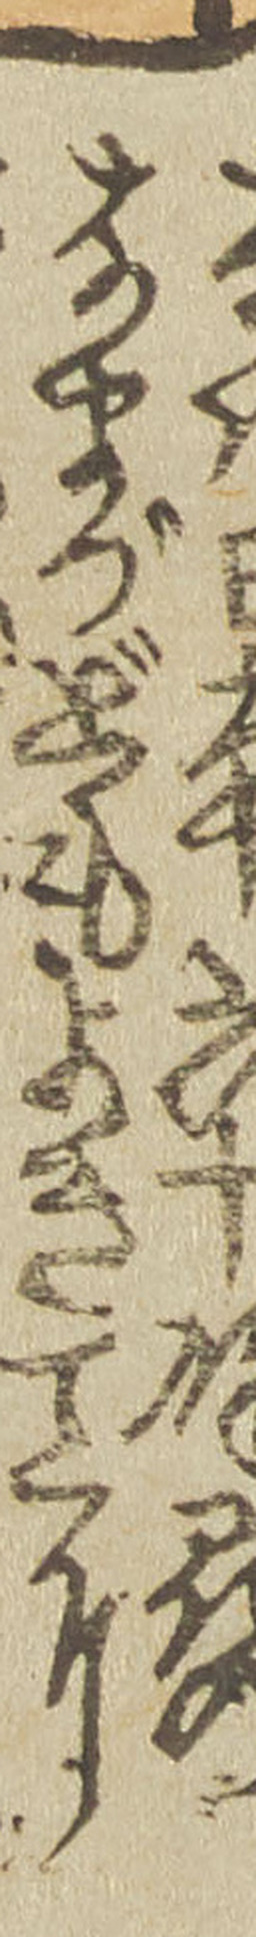なまづどもよきことに
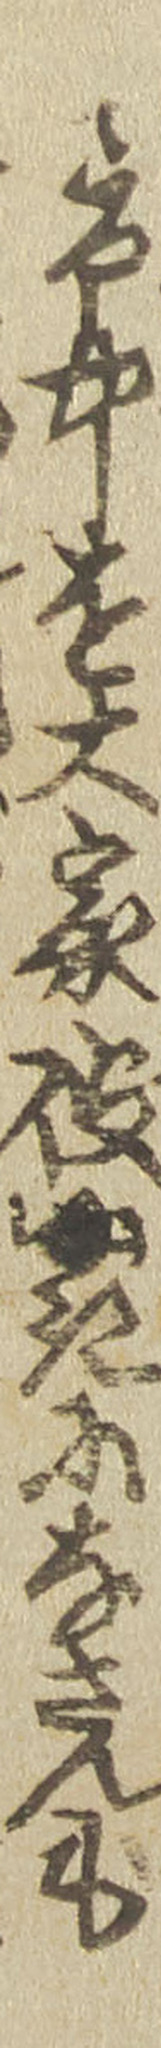市中を大家破やきになさんも
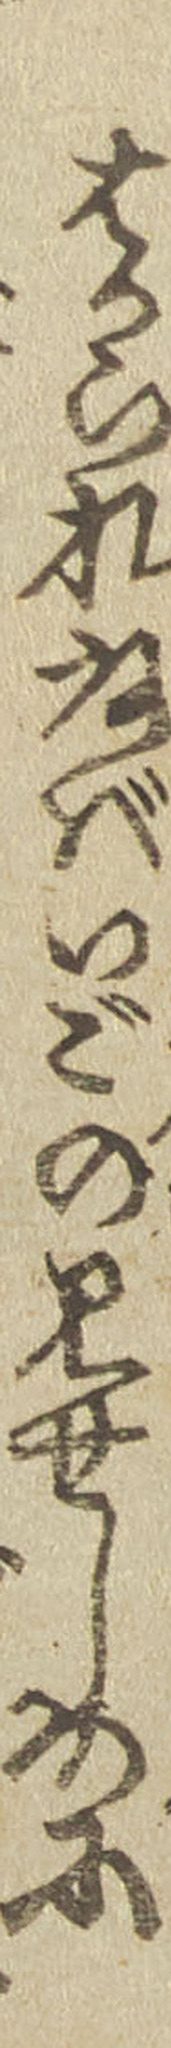はかられねばいごのみせしめに
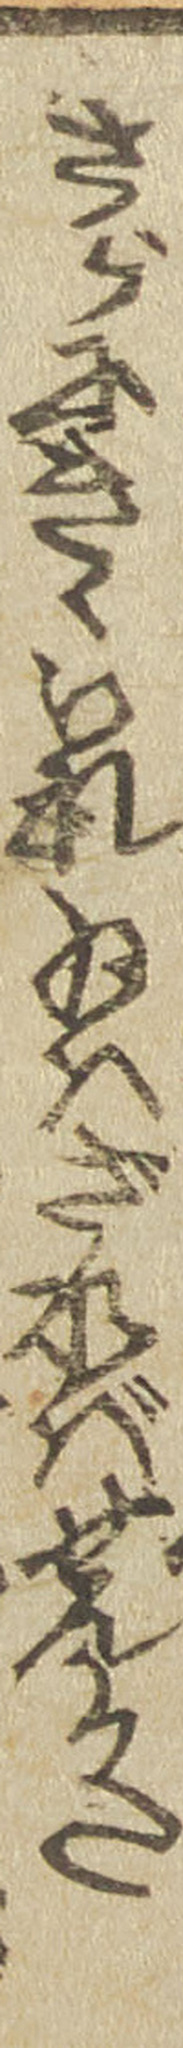さらにきゝいれ給はざればせんかた
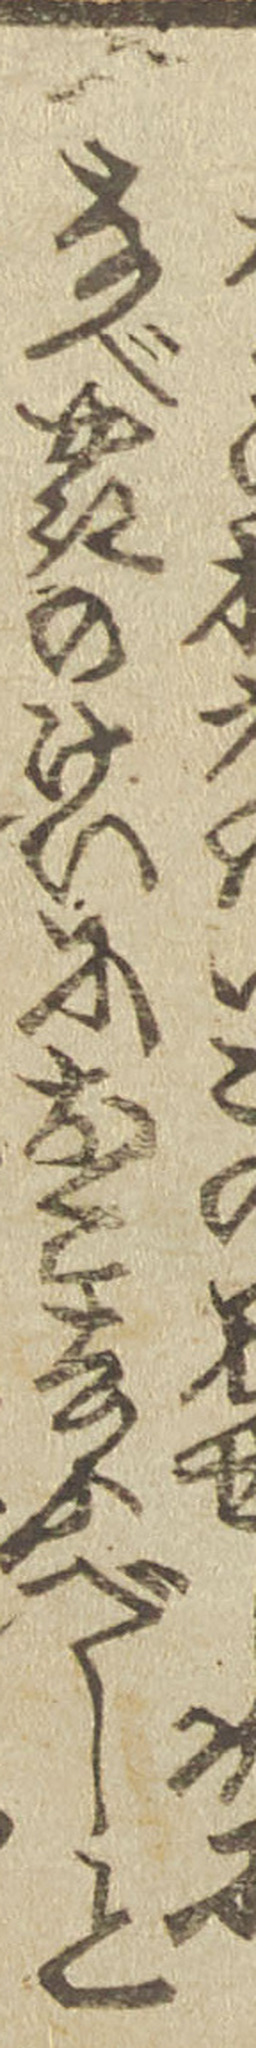なべやきのけいにおこなふべしと
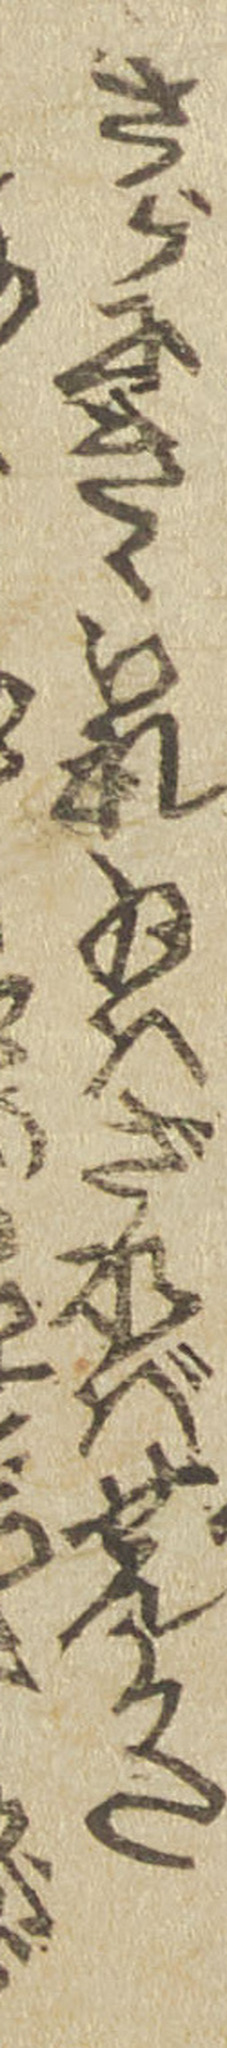さらにきゝいれ給はざればせんかた
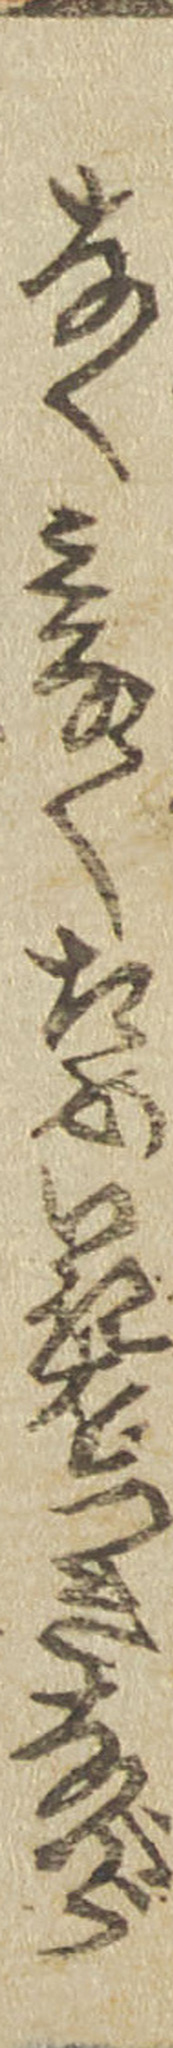なくみな〳〵ためいきをつきながら
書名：生捕ました三度の大地震
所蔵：東京大学総合図書館 General Library in the University of Tokyo, JAPAN
